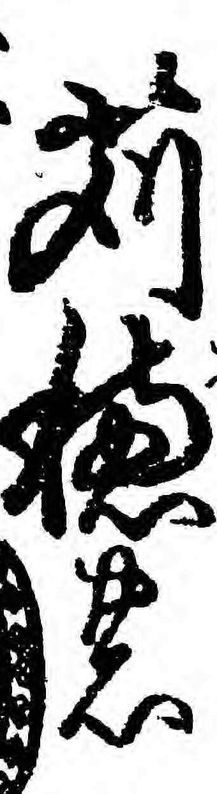苅穂の
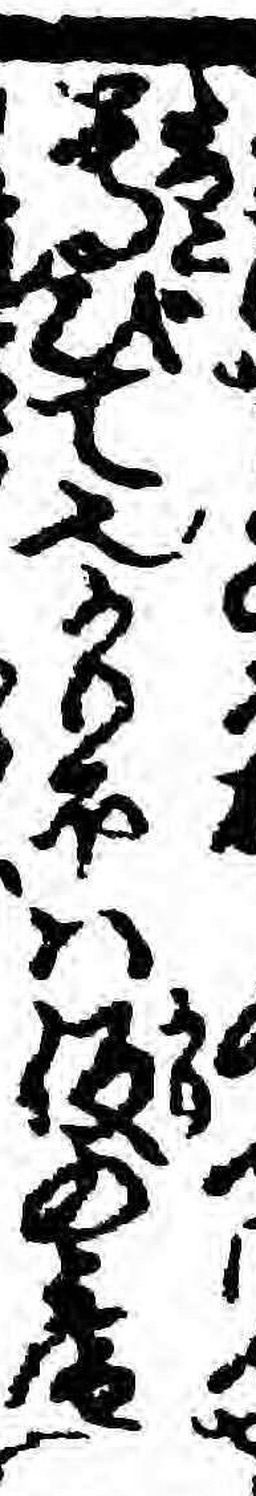尊びて也かりほは仮の庵
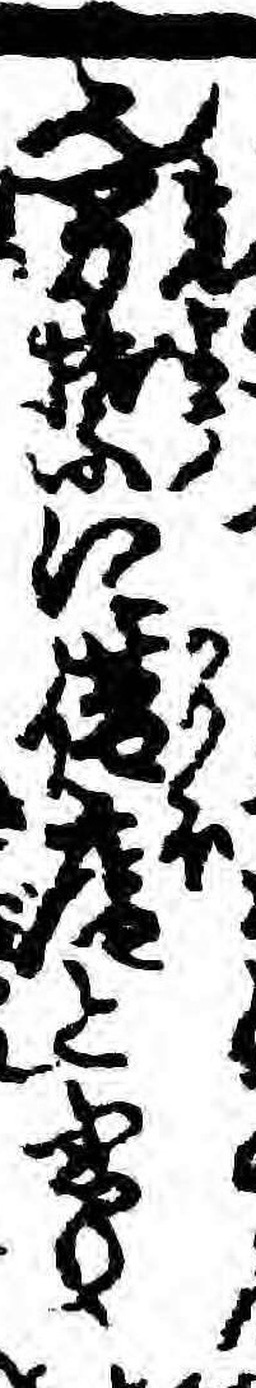也万葉に借庵と書り
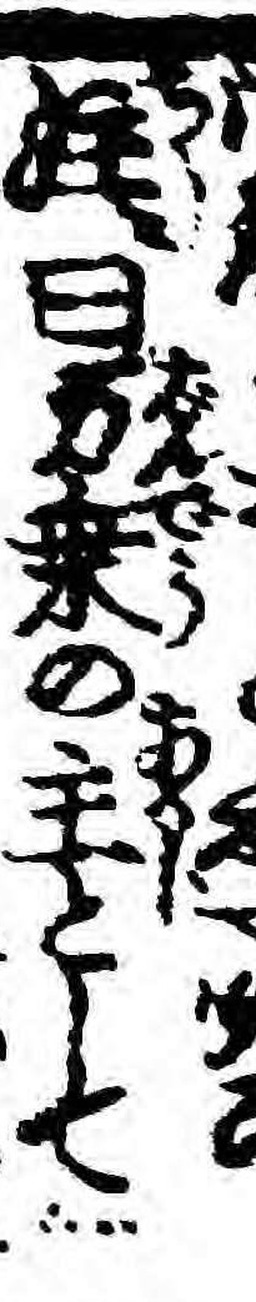注に曰万乗の主として
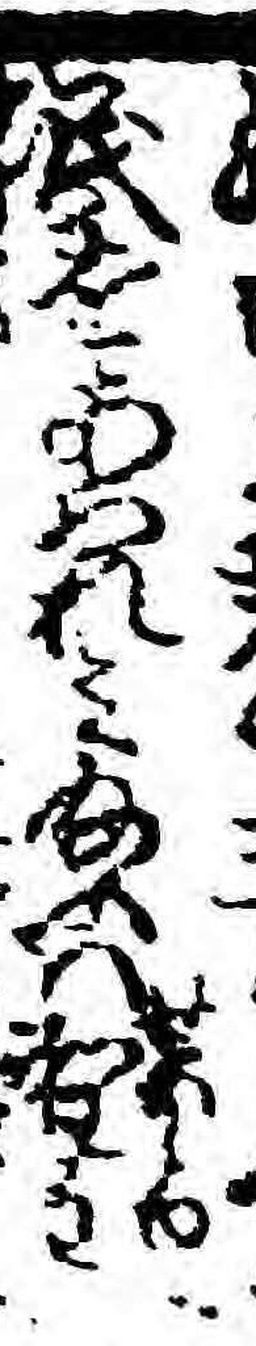民をあはれみ給ふは聖主
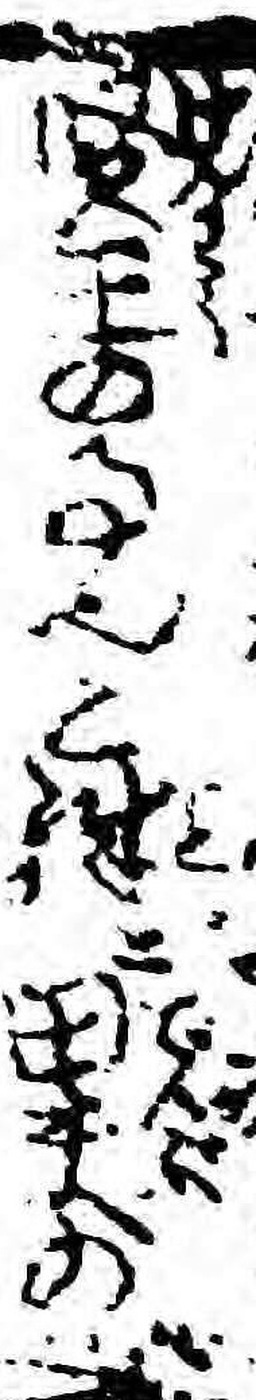賢王の事也と殊に田夫の
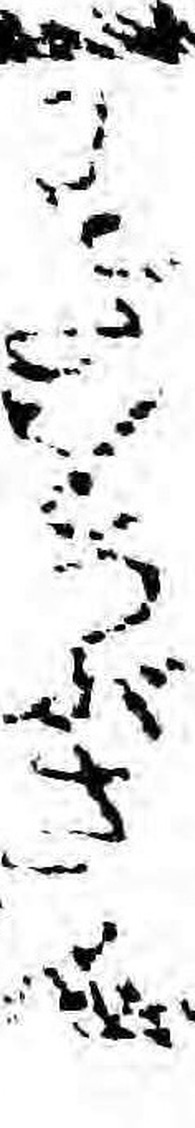わざをつぶさ
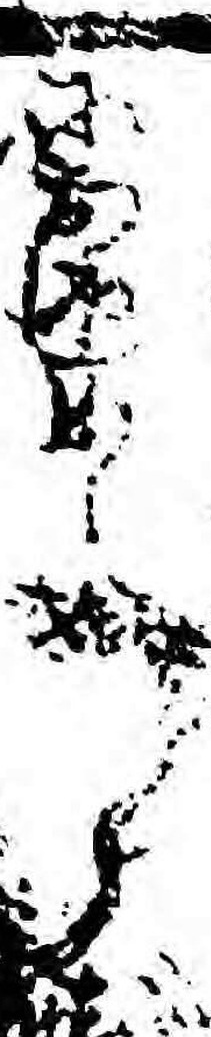におほしめし
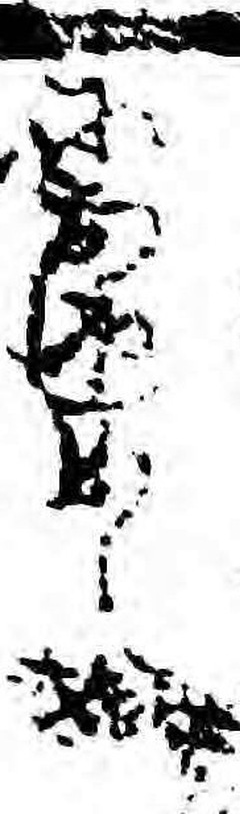におほしめし
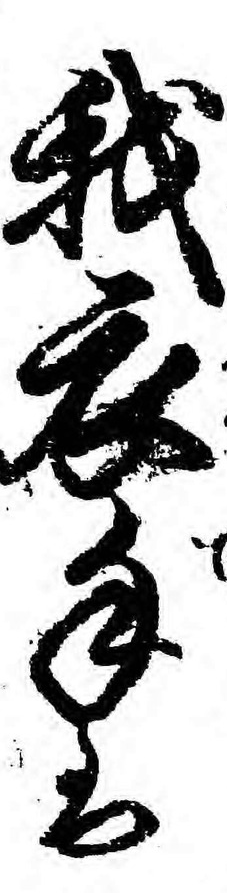我衣手は
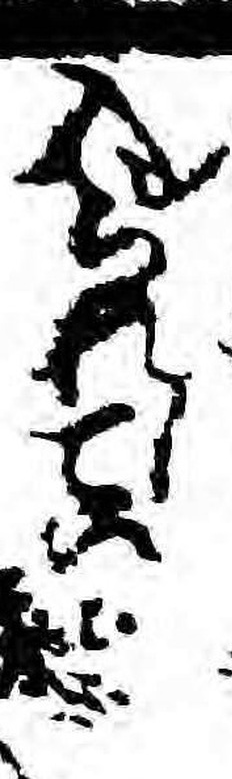入れられしてい
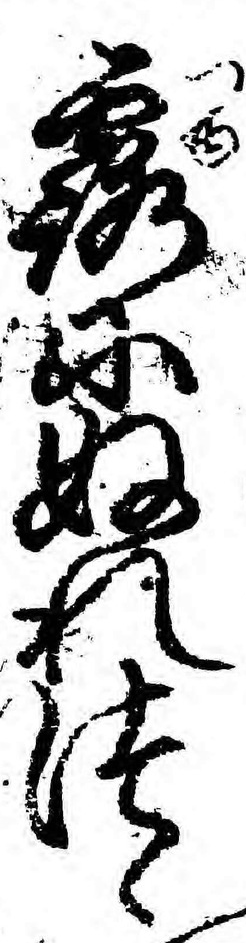露にぬれつゝ

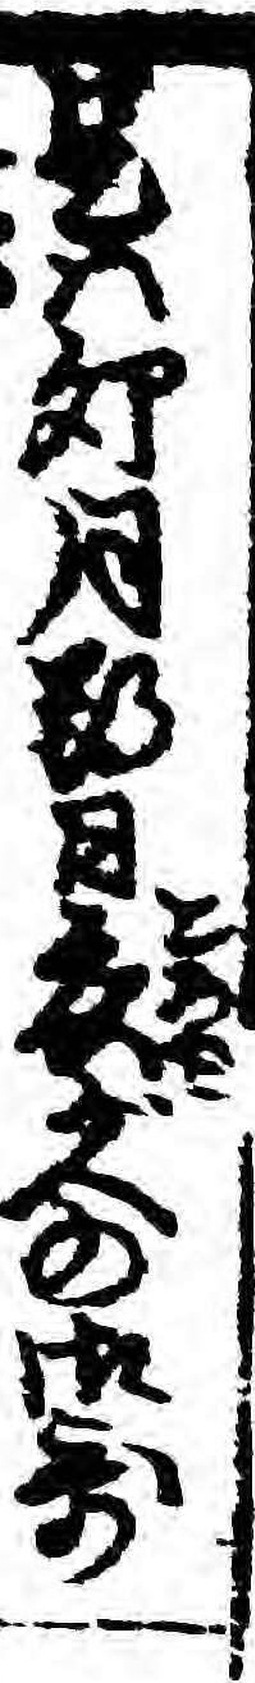是は卯月朔日衣かへの御哥
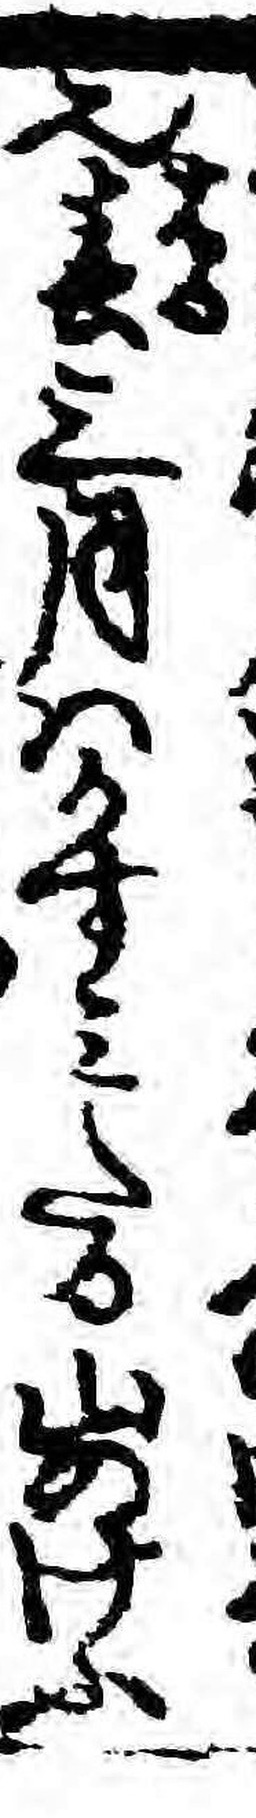也春三月はかすみたる山のけふ
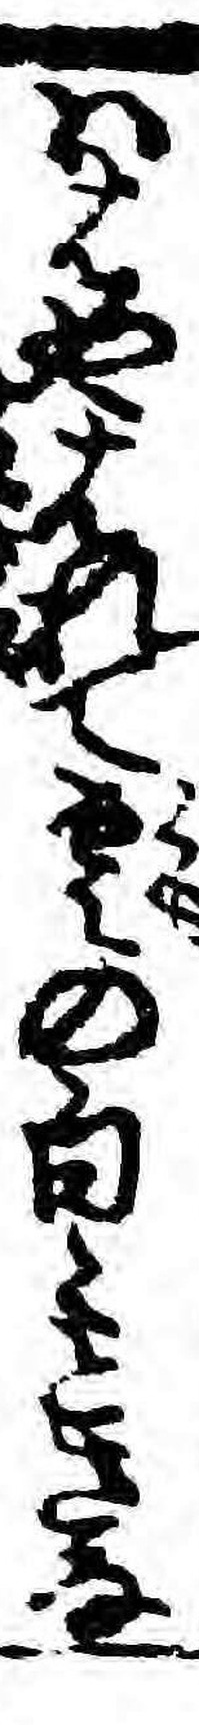ははやはれて雲の白々とさな
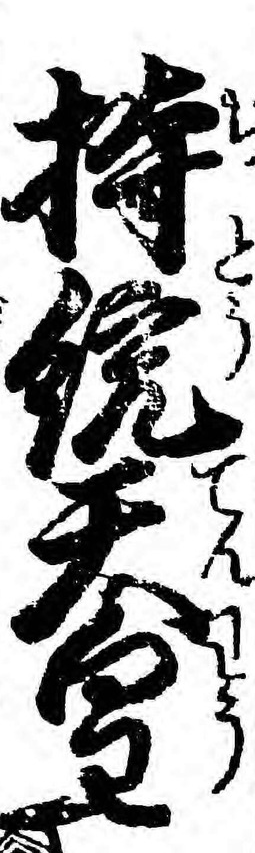持統天皇
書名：頭書和歌注譯／壽賀多百人一首小倉錦
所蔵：国文学研究資料館
